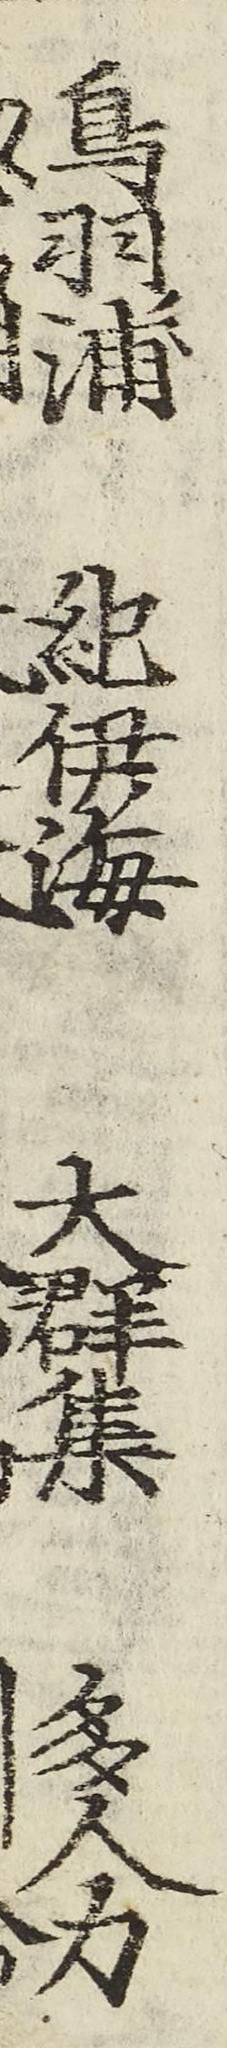鳥羽浦紀伊ノ海大群集多人力
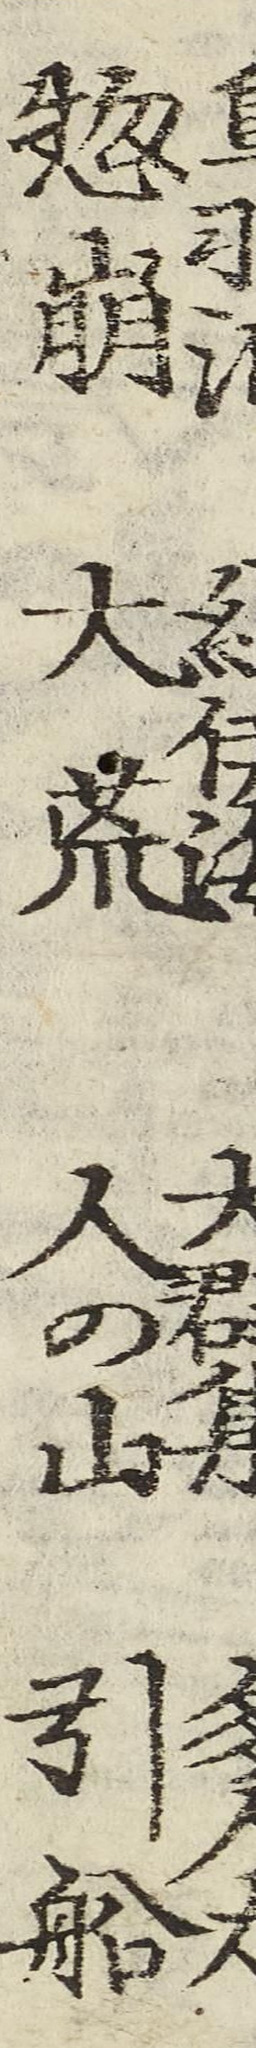惣崩大荒人の山引船

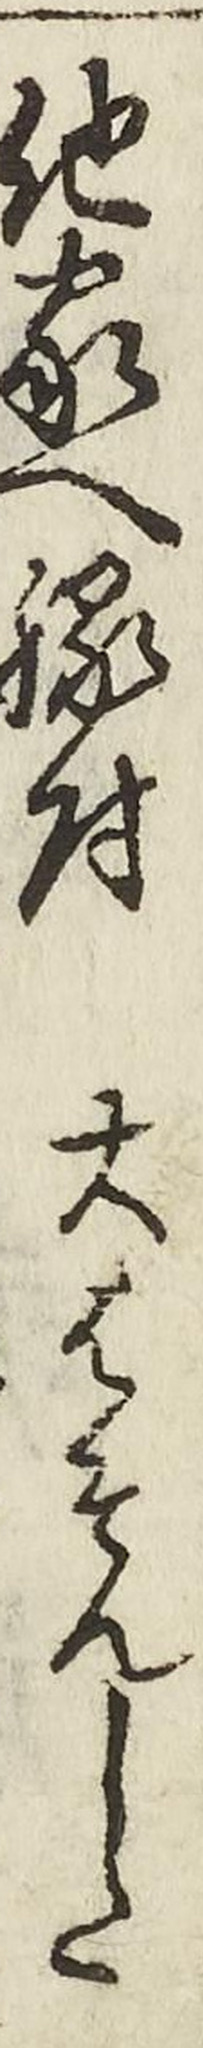他家へ縁付大はそんした
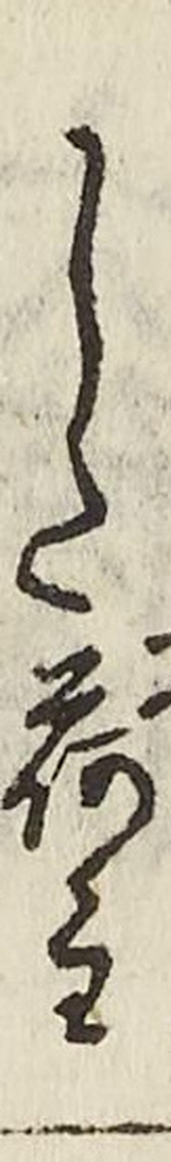した荷主
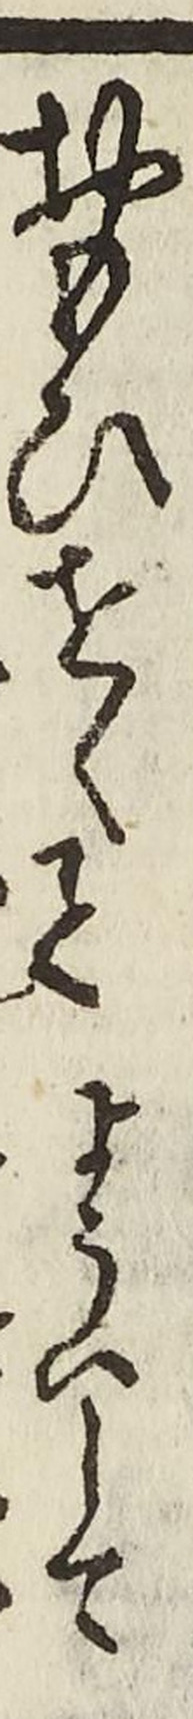おもひをくことよういして
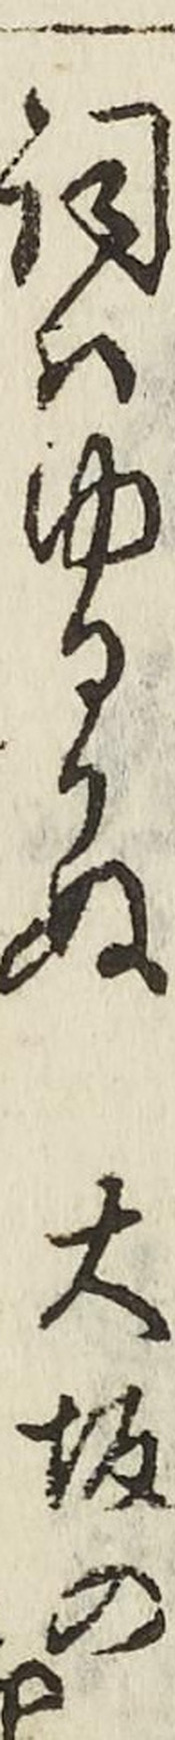詞はゆるかぬ大坂の
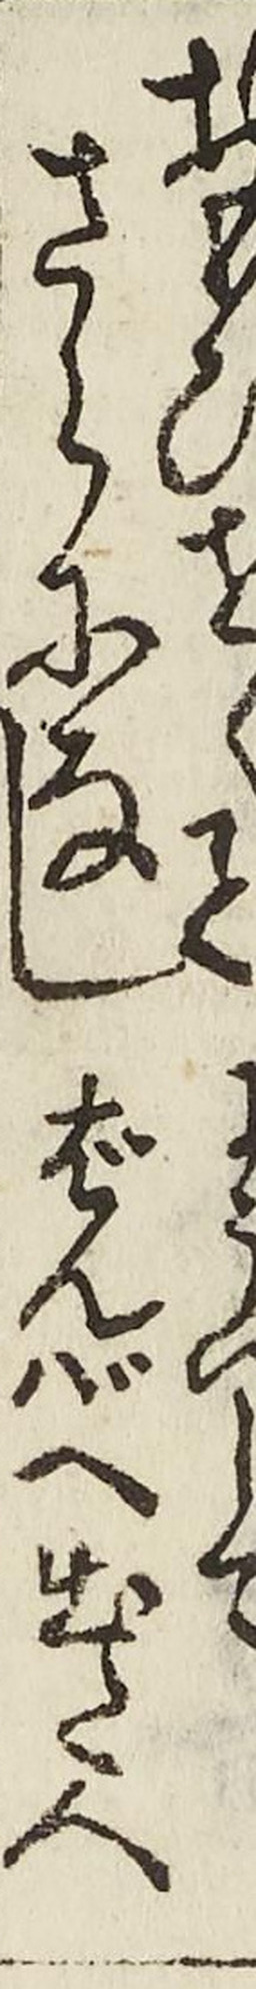さらになしばんばへ出た人
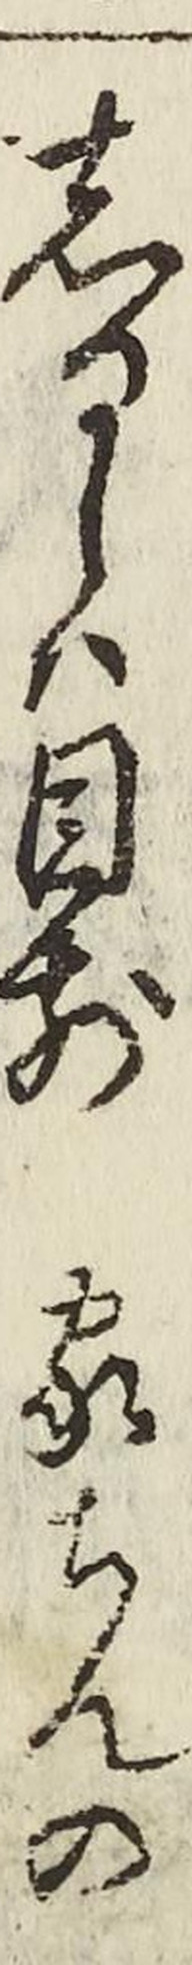しるしは目前家ちんの
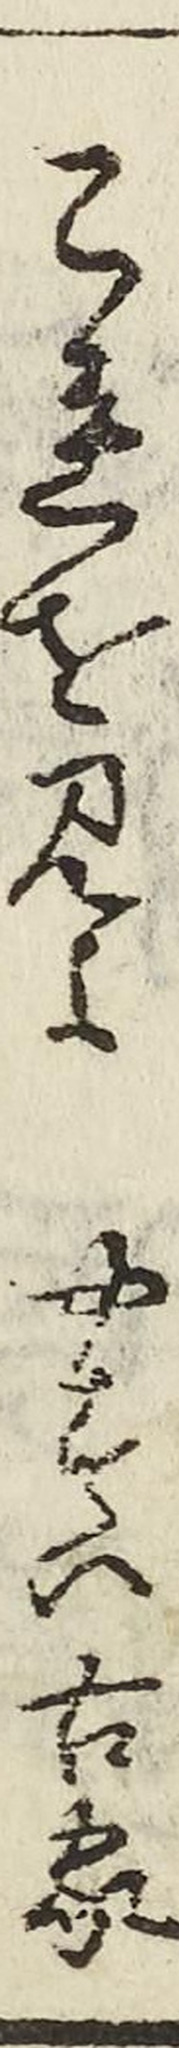これを見よやすい古家
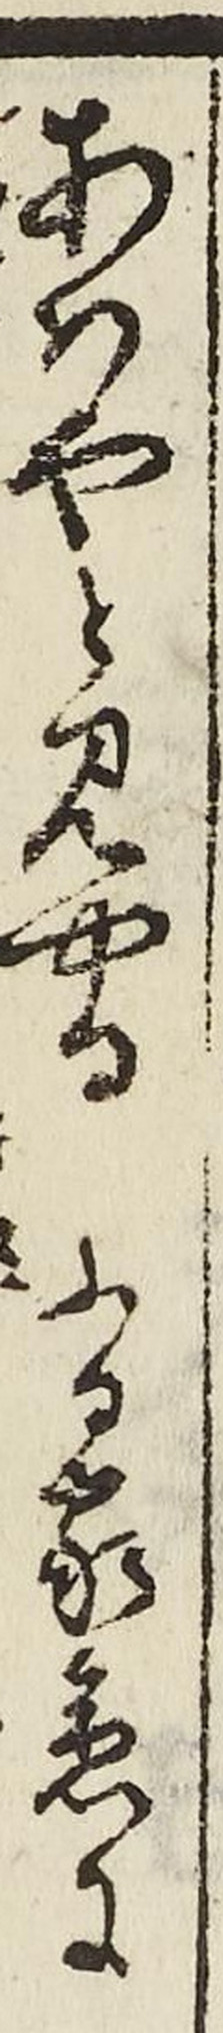あはやと見ゆるふる家急に
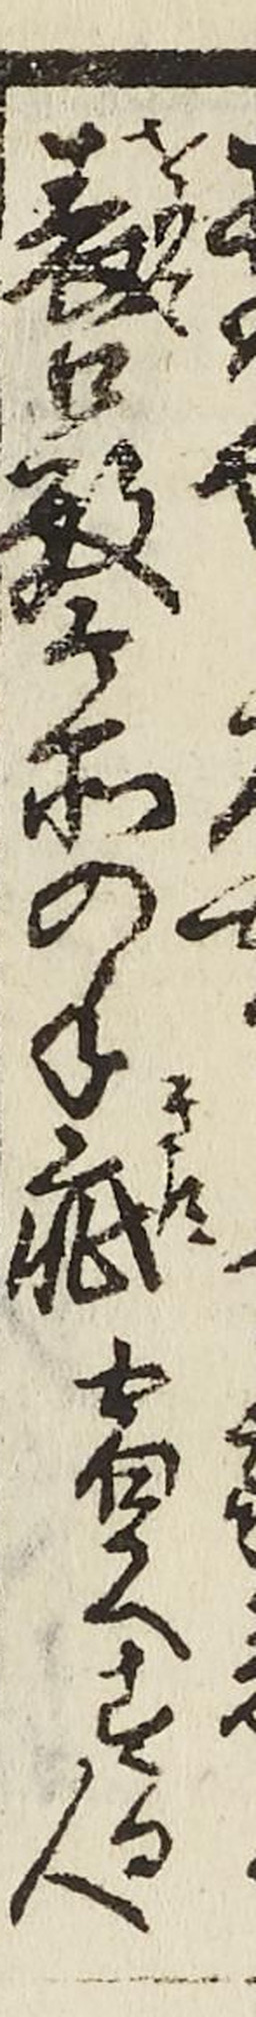表口数ケ所の手疵宿かへする人
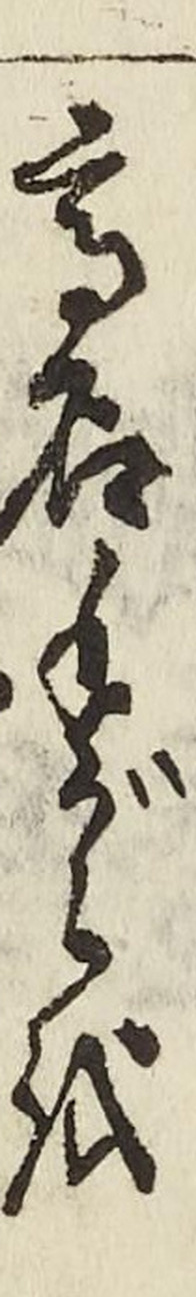高名手がらを
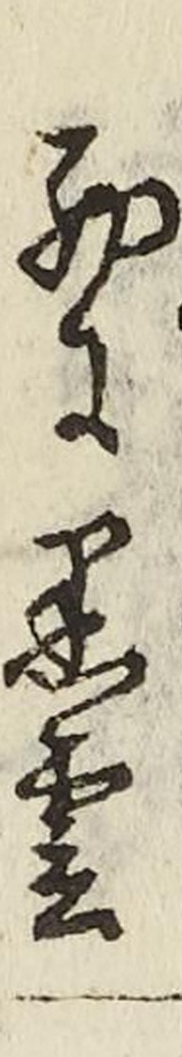西に黒雲
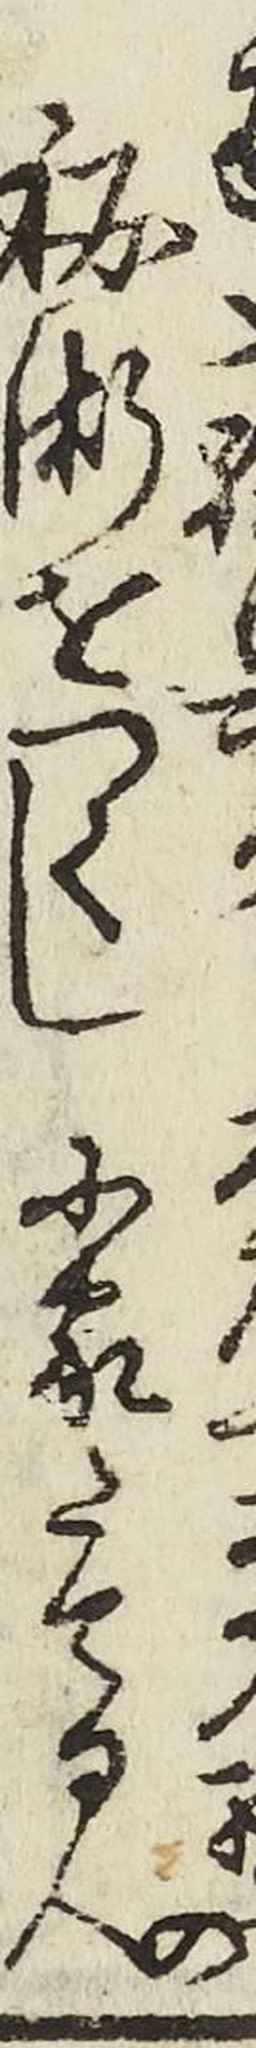秘術をつくし小家たてる人
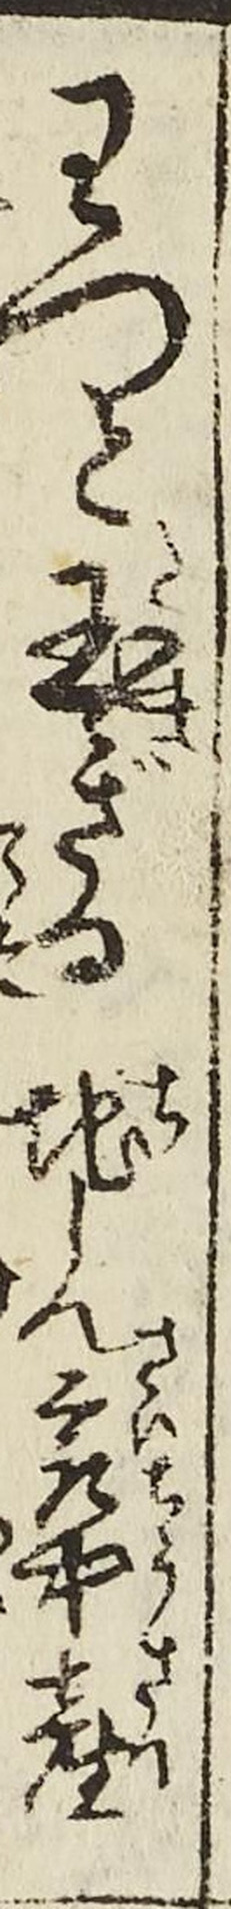わつと玉ぎる地しん最中産
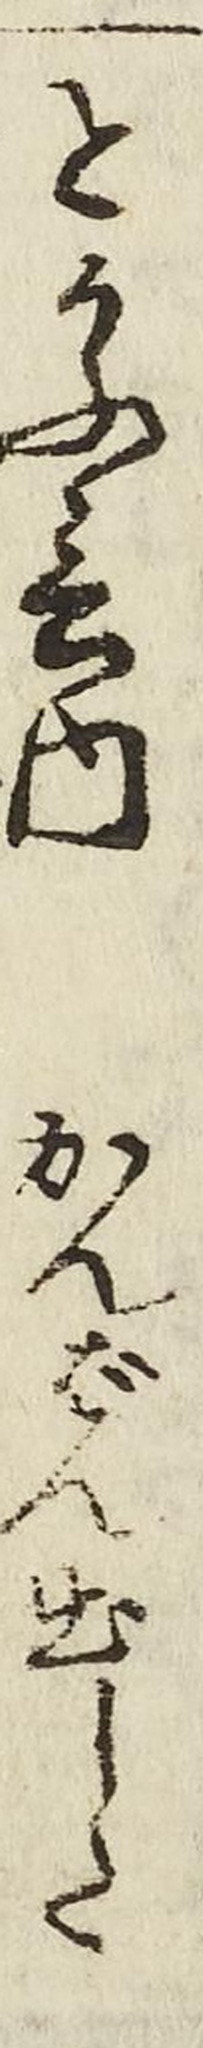とかふ言内かんばん出した
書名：地震津浪末代噺の種　全
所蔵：東京大学地震研究所図書室 Earthquake Research Institute Library, The University of Tokyo, JAPAN
